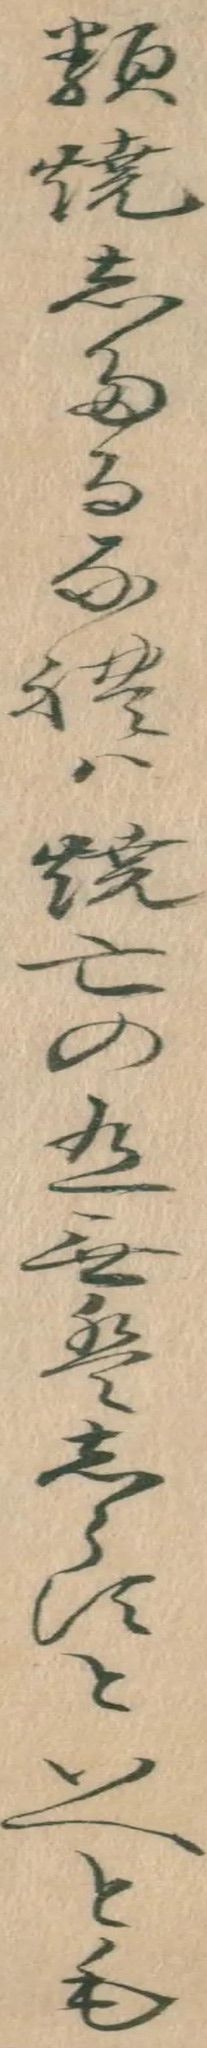類焼したるなれは焼亡の有無はしらすといへとも
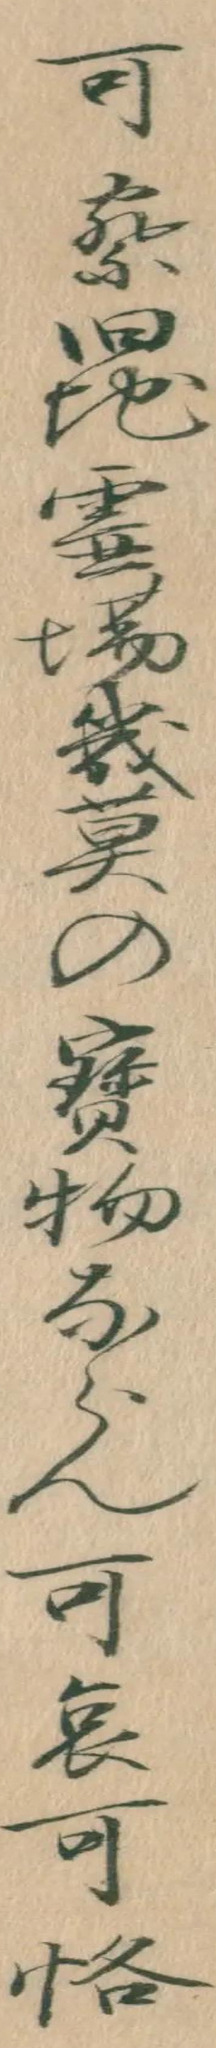可察旧地霊場幾莫の寶物ならん可哀可恪
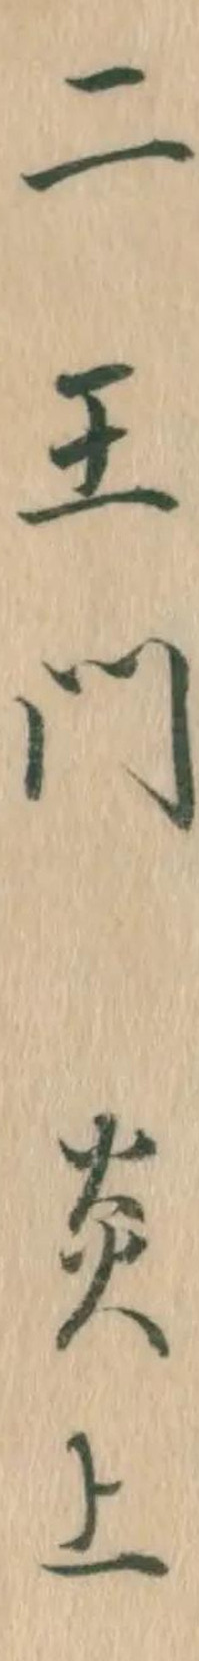二王門炎上
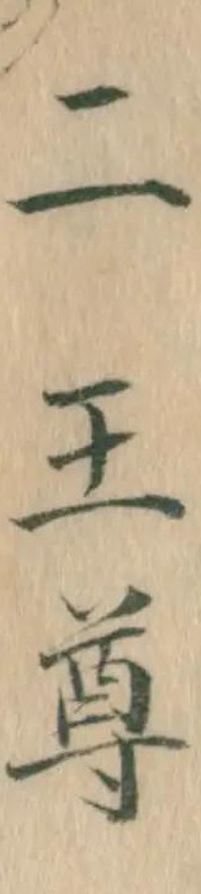二王尊
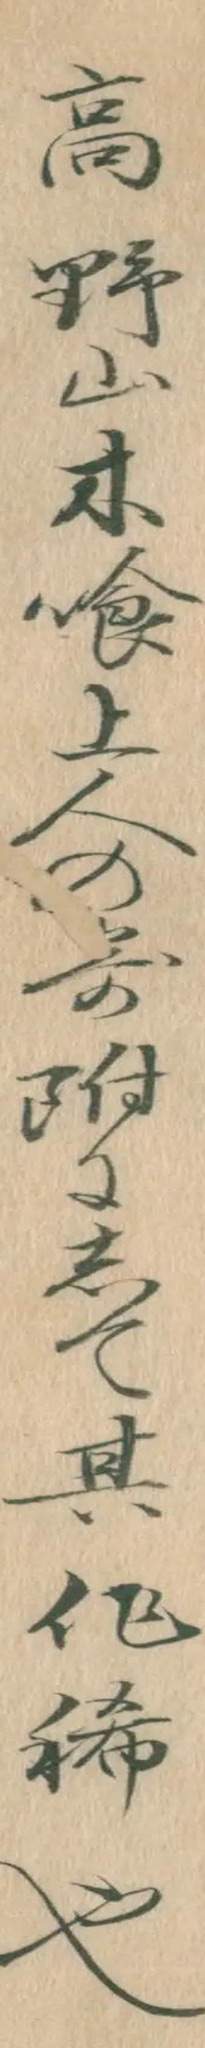高野山木喰上人の寄附にして其作稀也
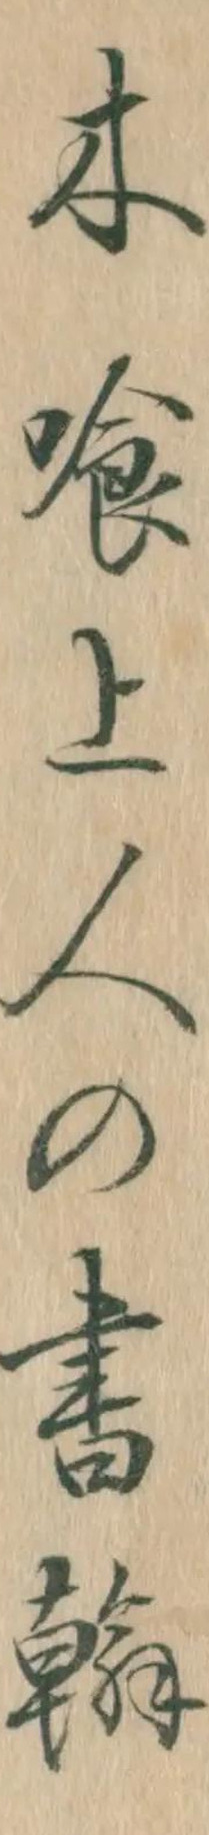木喰上人の書翰

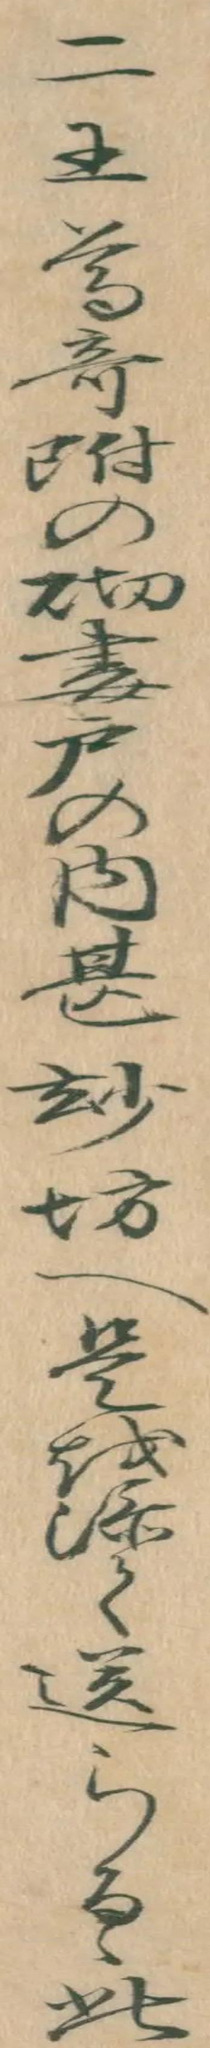二王尊寄附の砌妻戸の内甚玅坊へ是を添て送らるゝ此
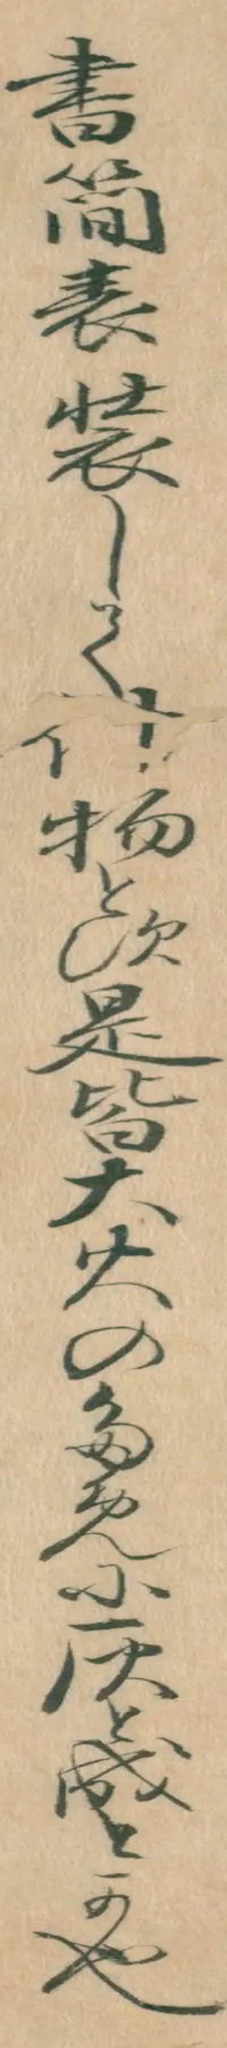書簡表装して什物とす是皆大火のために灰と成とかや
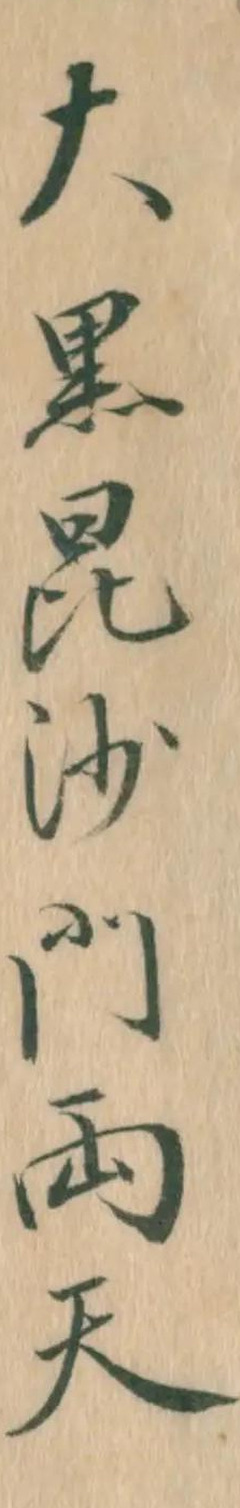大黒毘沙門両天
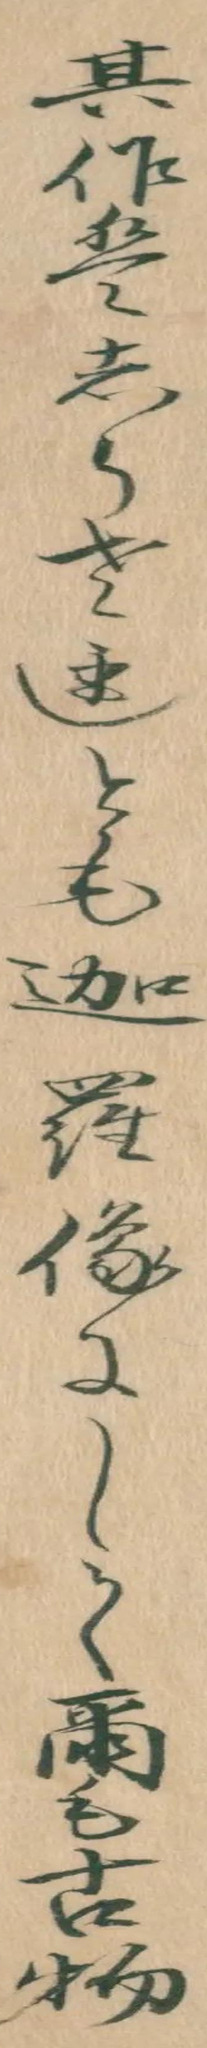其作はしらされとも伽羅像にして爾も古物
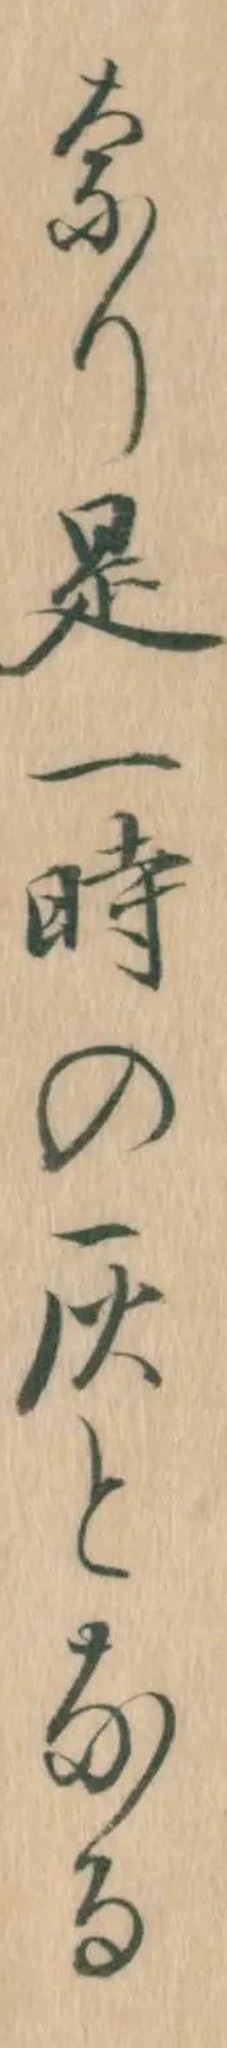なり是一時の灰となる
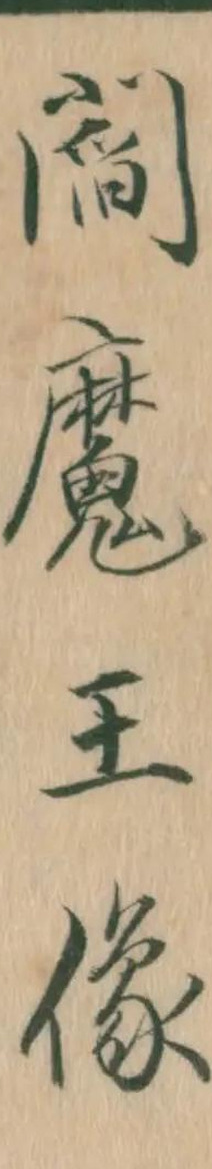閻魔王像
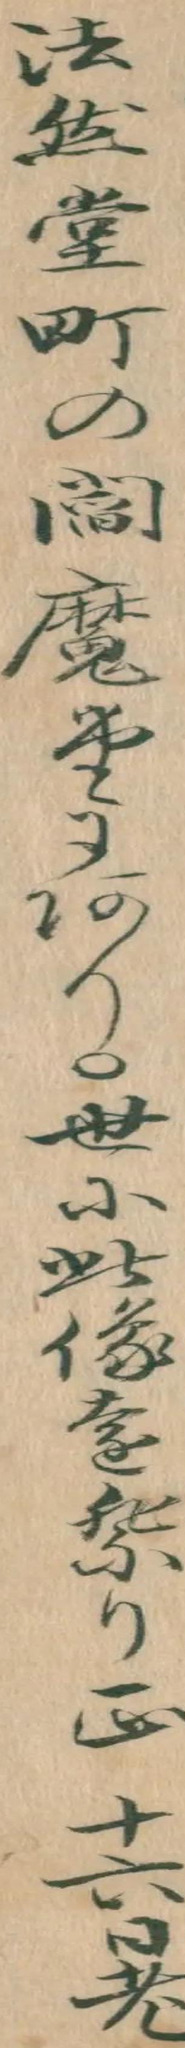法然堂町の閻魔堂にあり○世に此像を祭り正十六日老
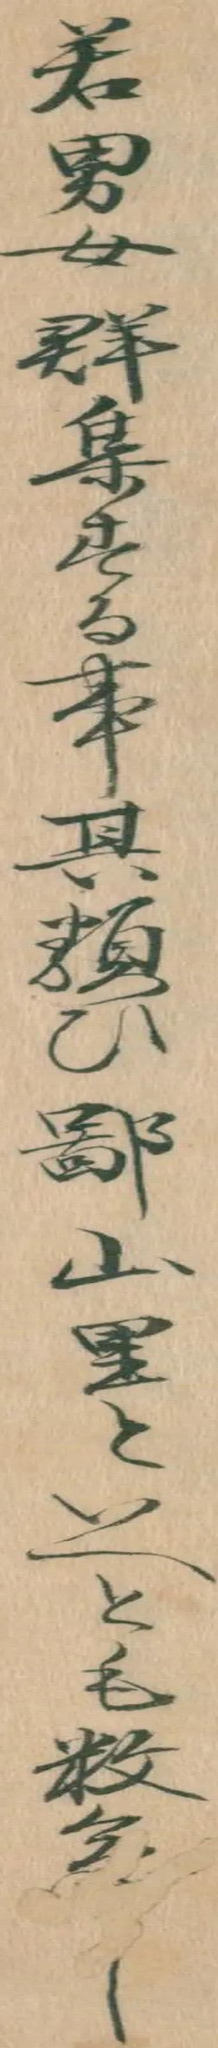若男女群集する事其類ひ鄙山里といへとも数多し
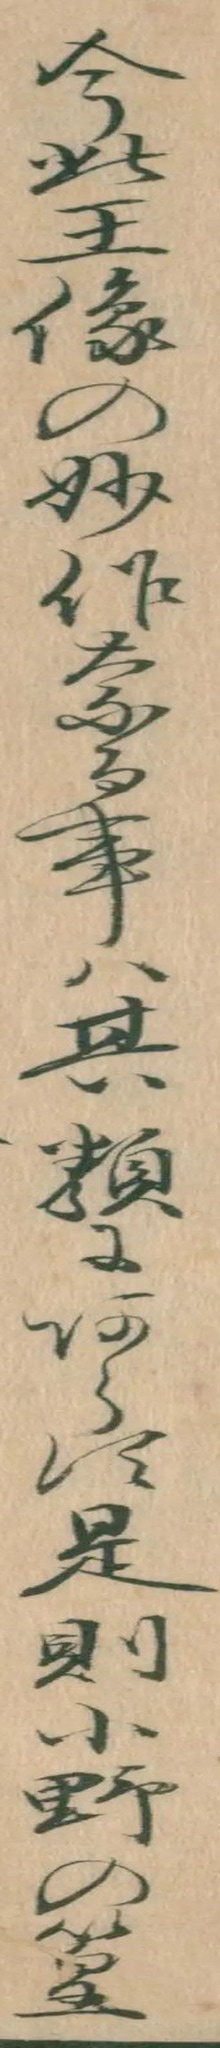今此王像の妙作なる事は其類にあらす是則小野の篁
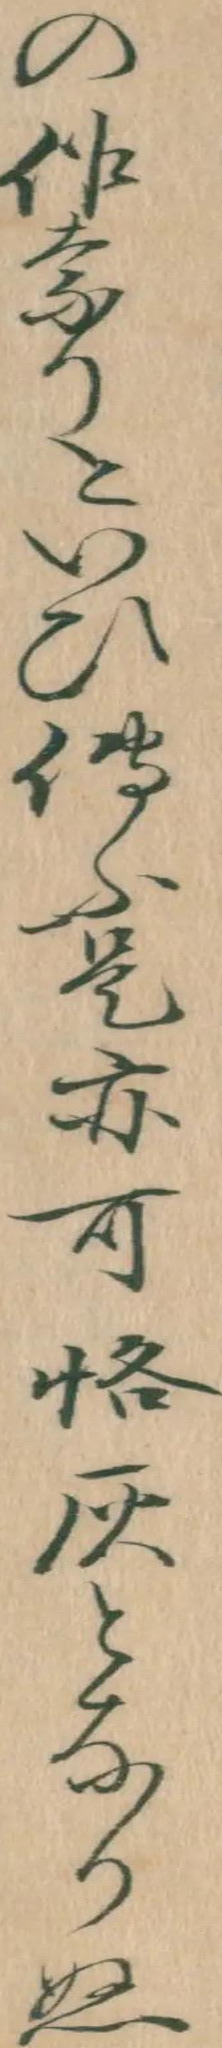の作なりといひ傳ふ是亦可恪灰となりぬ
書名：俗語之種. [7]
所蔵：国立国会図書館 National Diet Library, JAPAN
